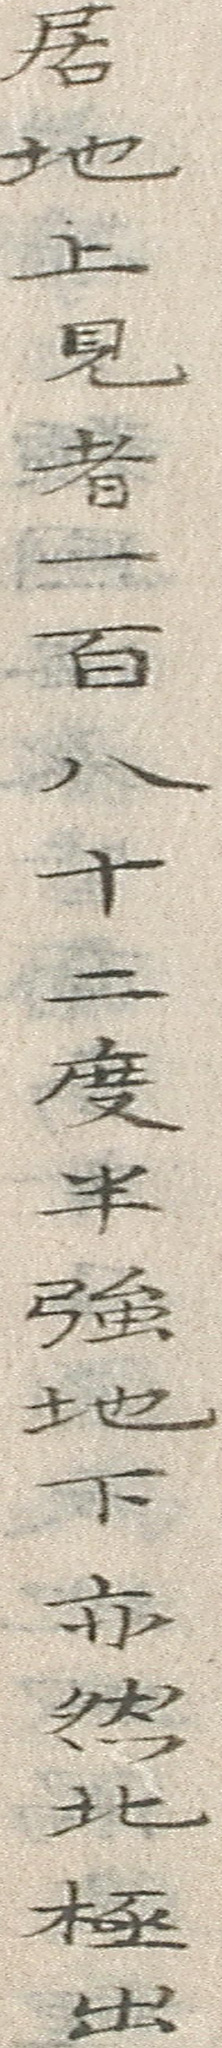居地上見者一百八十二度半強地下亦然北極出
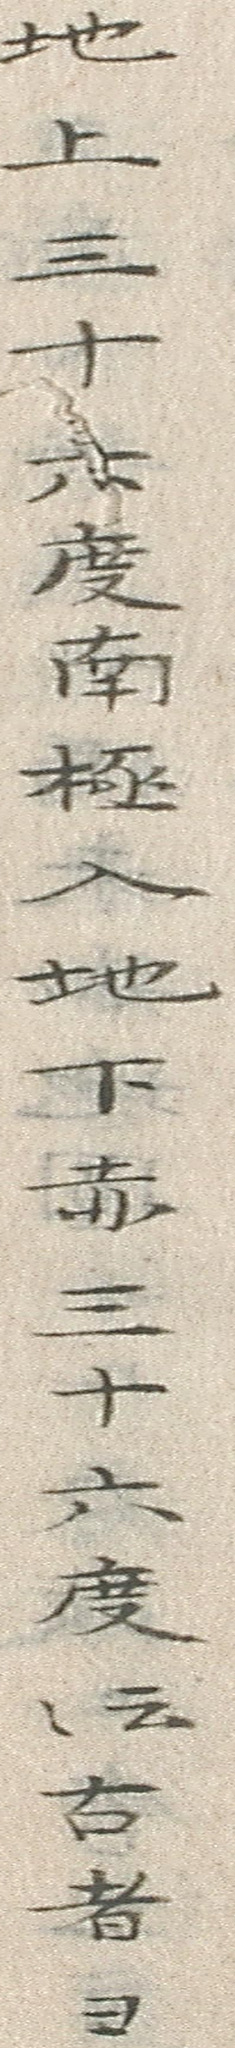地上三十六度南極入地下赤三十六度云〻古者ヨ
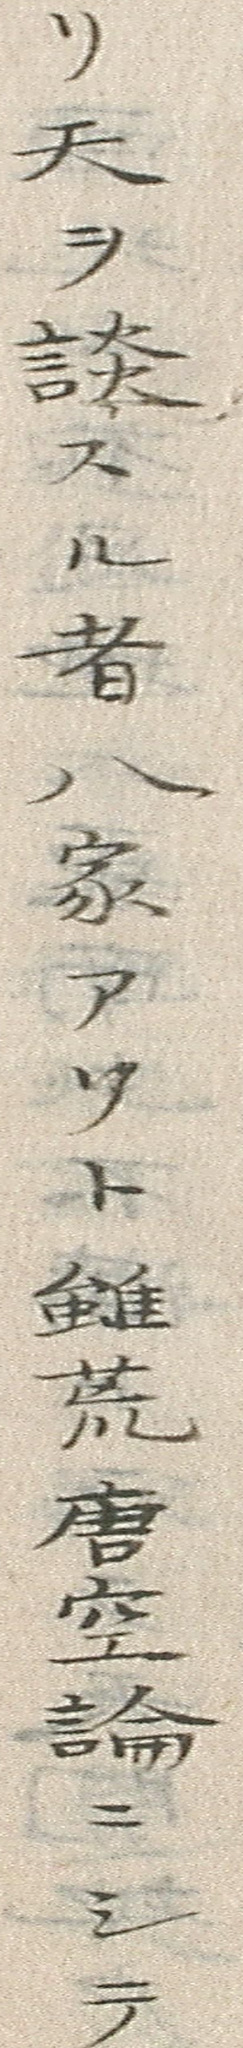リ天ヲ談スル者八家アリト雖荒唐空論ニシテ
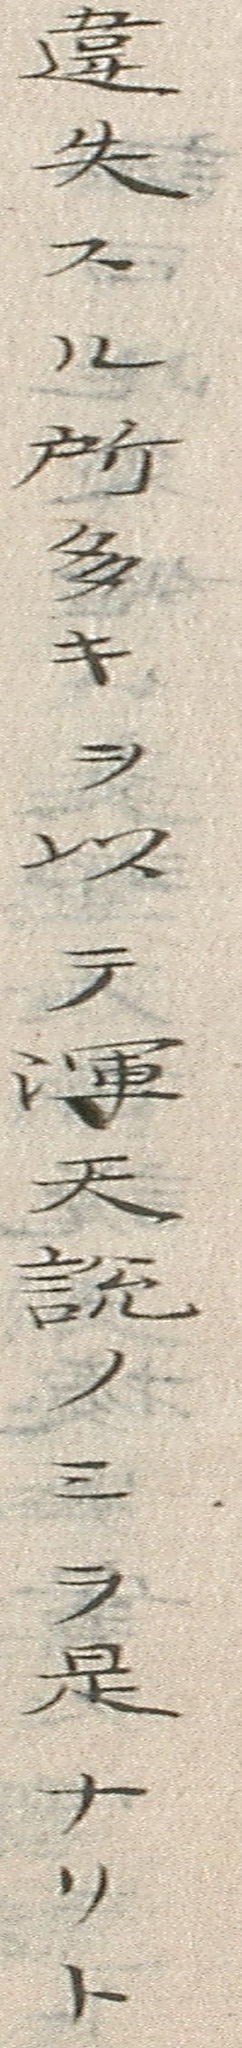違失スル所多キヲ以テ渾天説ノミヲ是ナリト
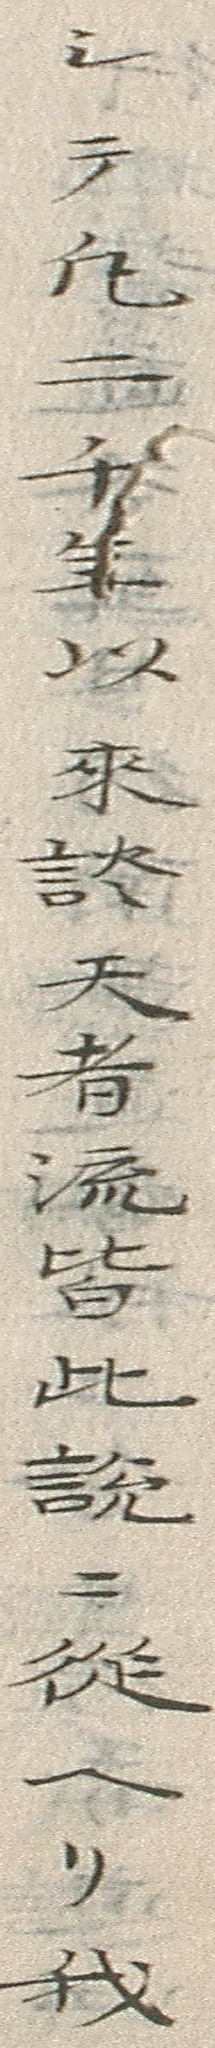シテ凡二千年以来談天者流皆此説ニ従ヘイ我
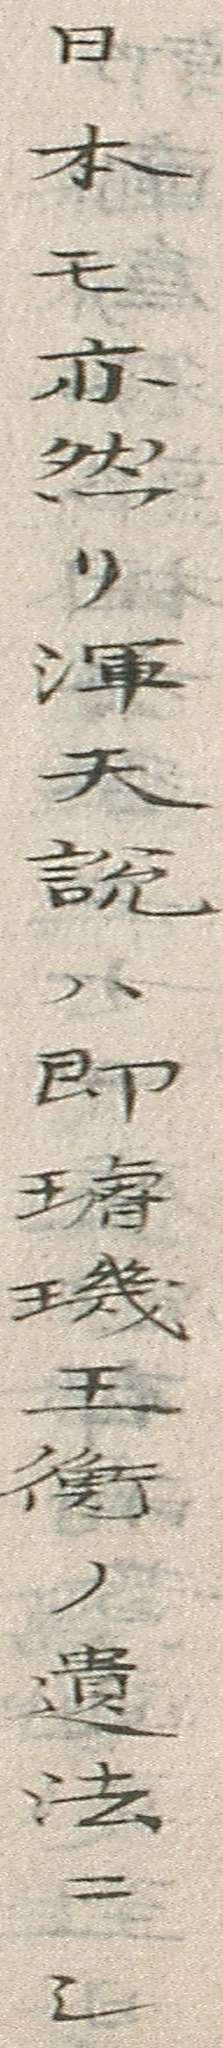日本モ亦然リ渾天説ハ即璿璣王衡ノ遺法ニシ
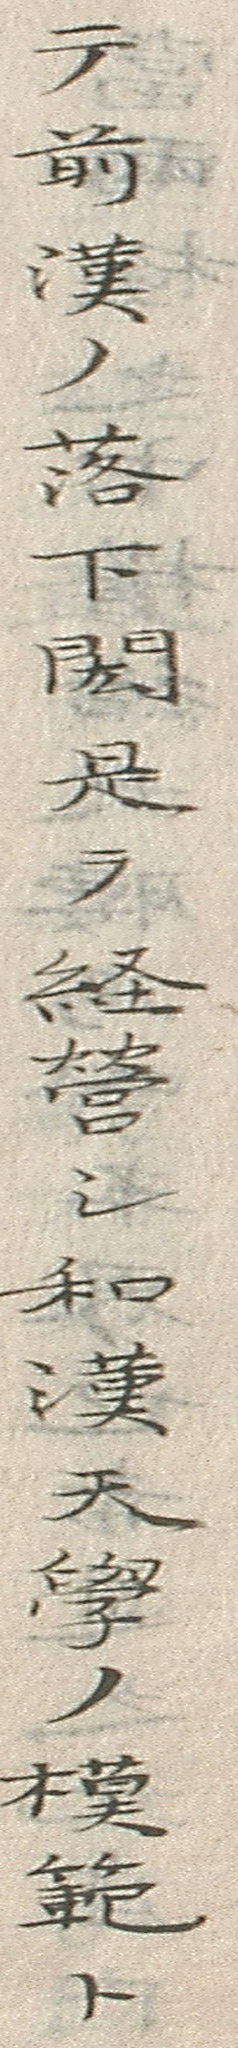テ前漢ノ落下閎是ヲ経営シ和漢天学ノ模範ト
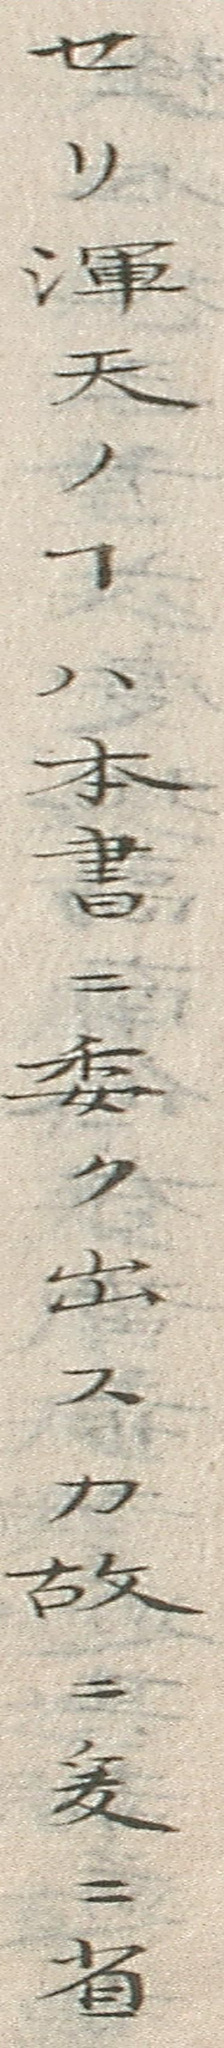セリ渾天ノコトハ本書ニ委ク出スカ故ニ爰ニ省
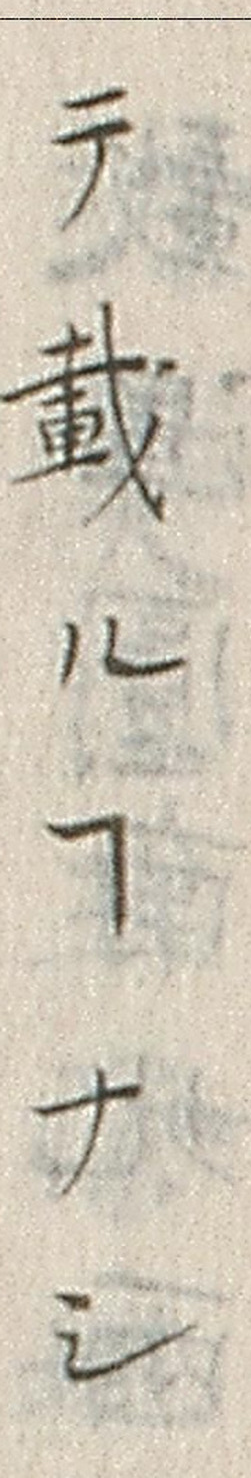テ載ルコトナシ
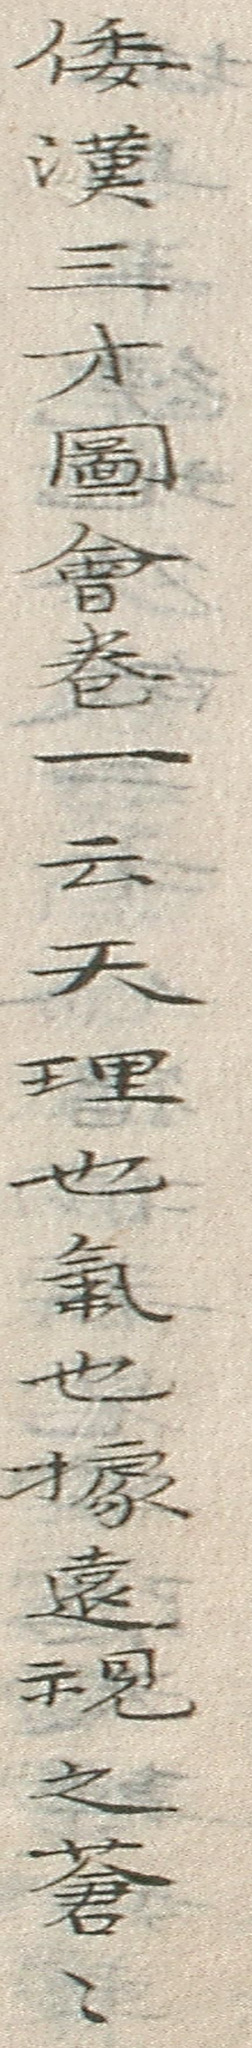倭漢三才図会巻一云天理也気也拠遠視之蒼〻
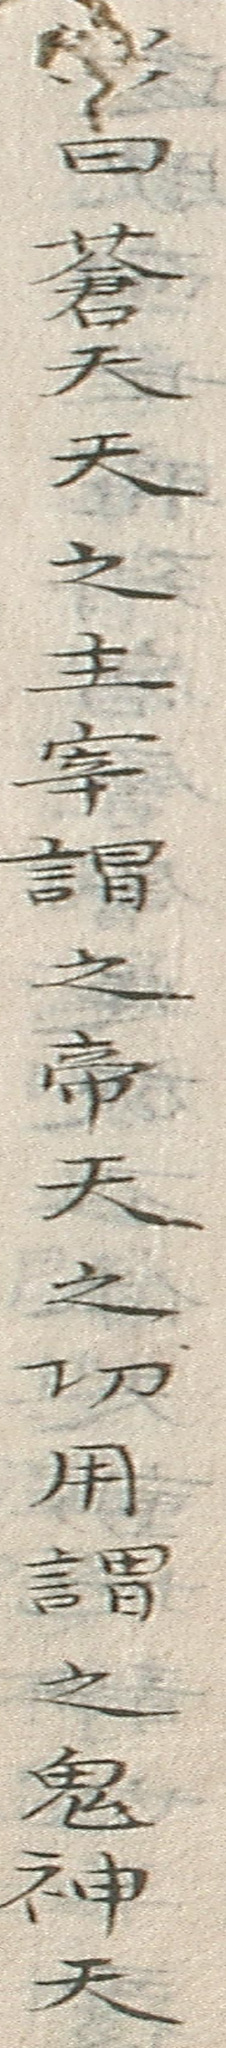然？曰蒼天天之主宰誯之帝天之切用謂之鬼神天
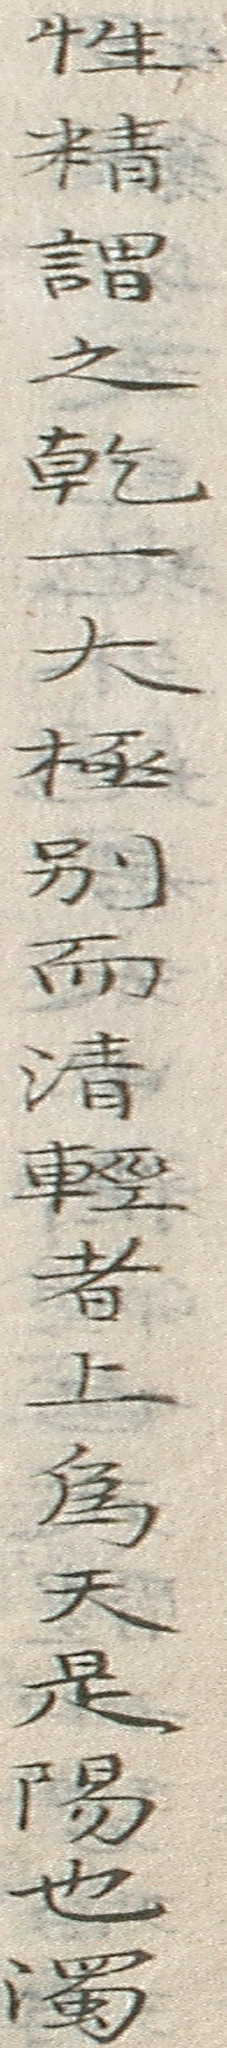性精謂之乾一大極別而清軽者上為天是陽也濁
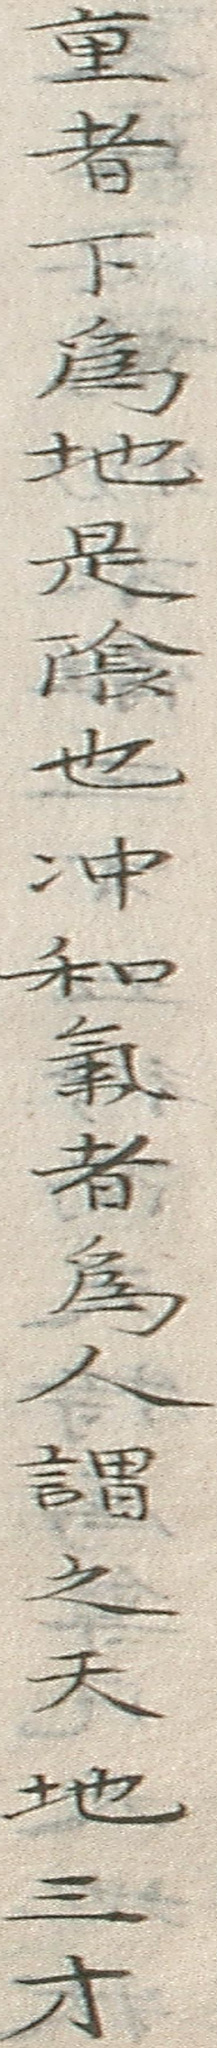重者下為地是陰也冲和気者為人謂之天地三才

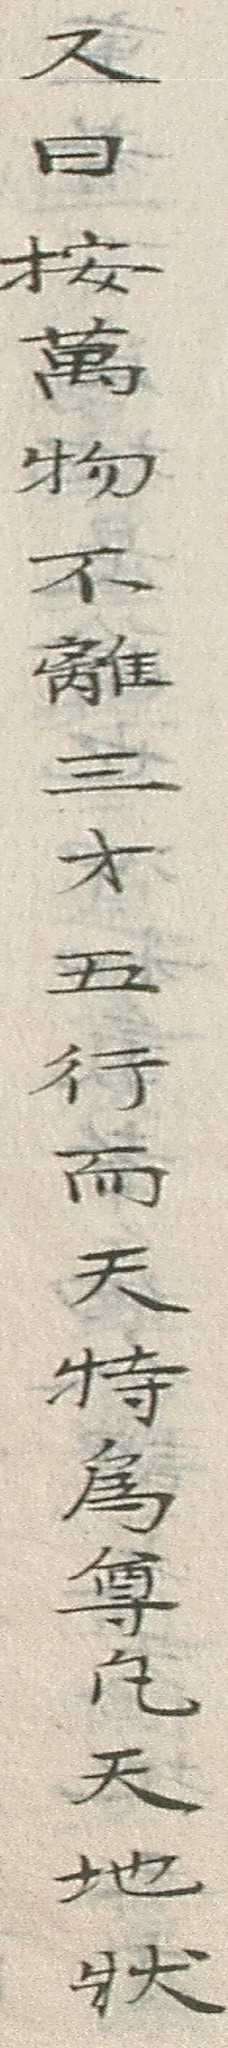又曰按万物不離三才五行而天特為尊凡天地状
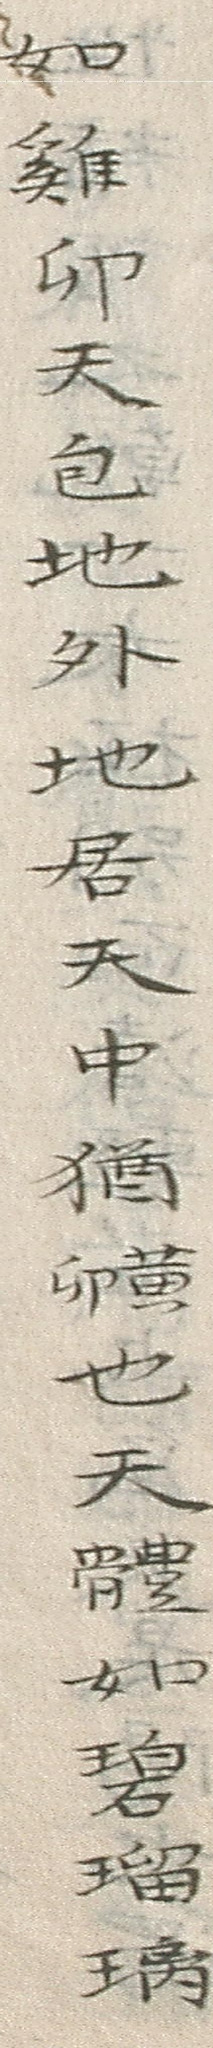如鶏卯天包地外地居天中猶黄卯也天体如碧瑠璃
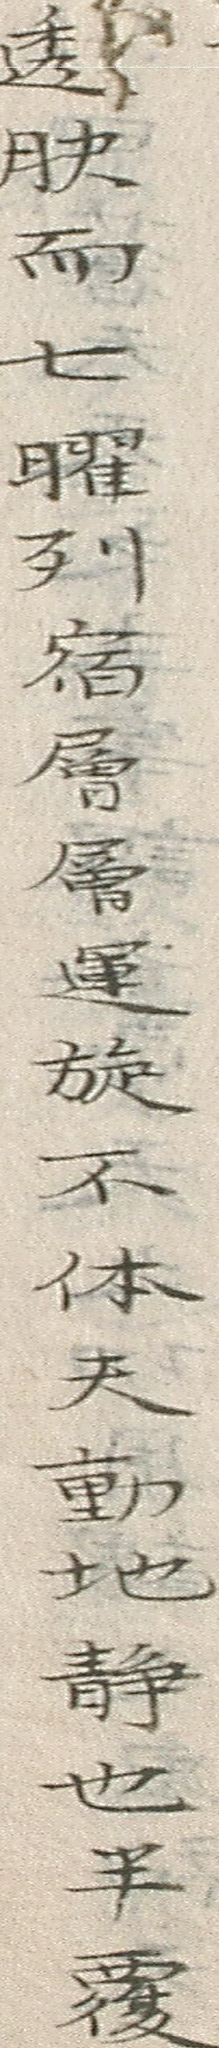透䏐而七曜列宿層層運旋不体天動地静也半覆
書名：天學略名目羽翼　全
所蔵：東京大学地震研究所図書室 Earthquake Research Institute Library, The University of Tokyo, JAPAN
